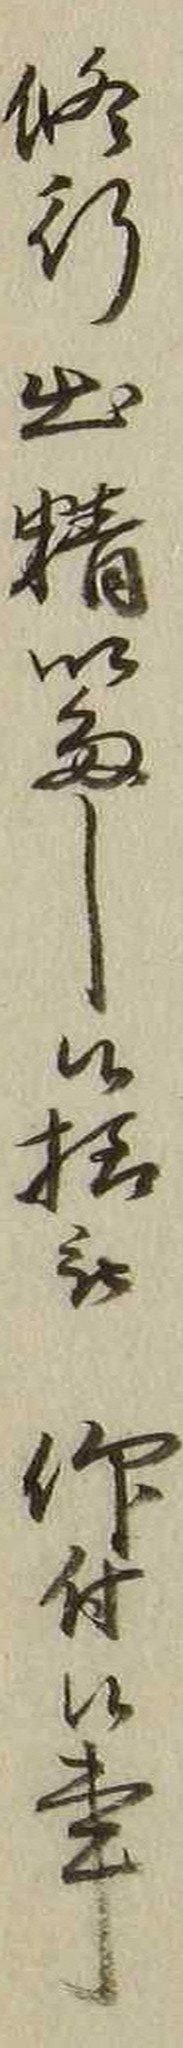修行出精いたし候様被仰付候事
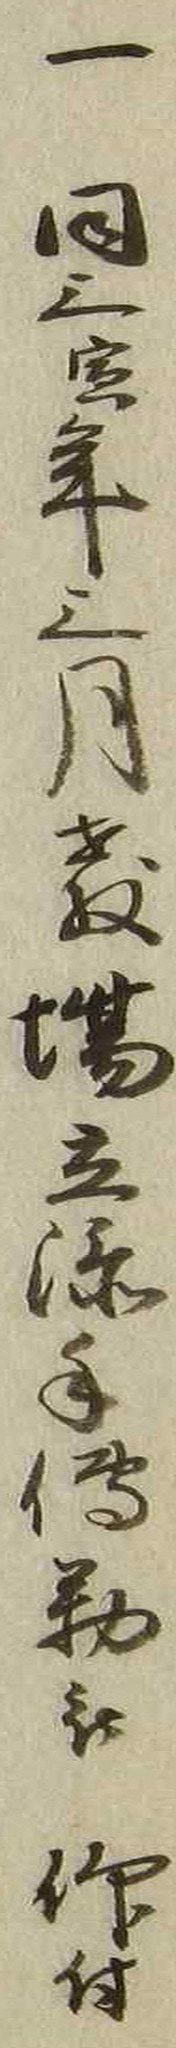一同三寅年三月教場立添手伝勤被仰付
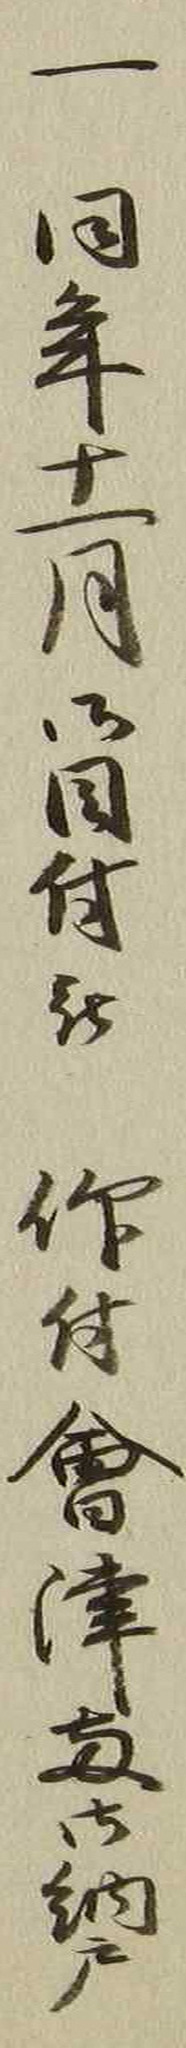一同年十月一御目付被仰付会津両御納戸
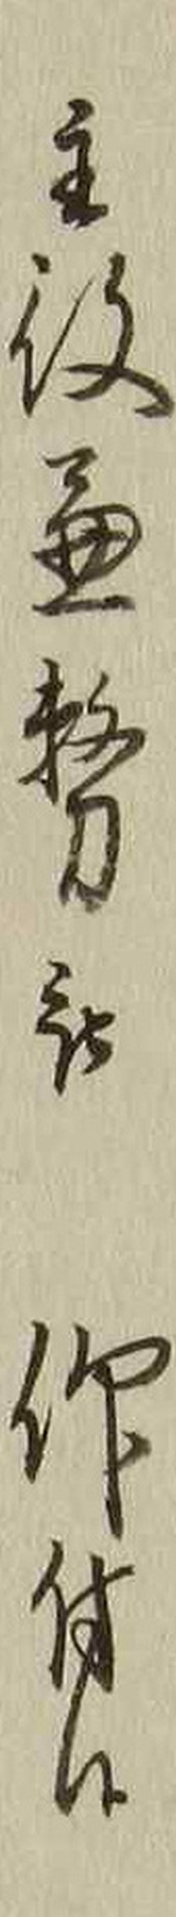主役兼務被仰付候
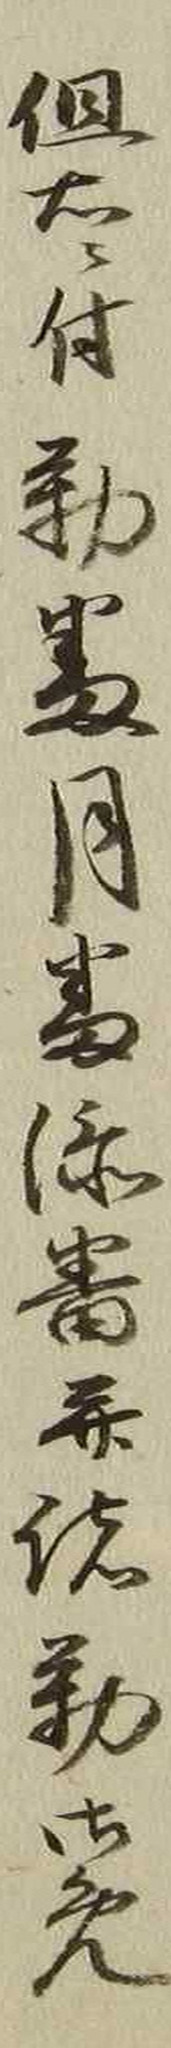但右に付勤番月番添番并諸勤御免
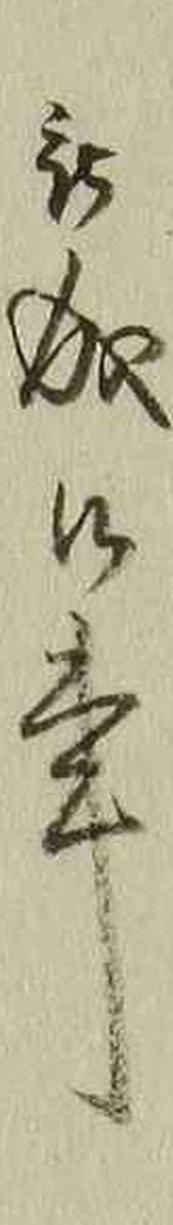被成候事
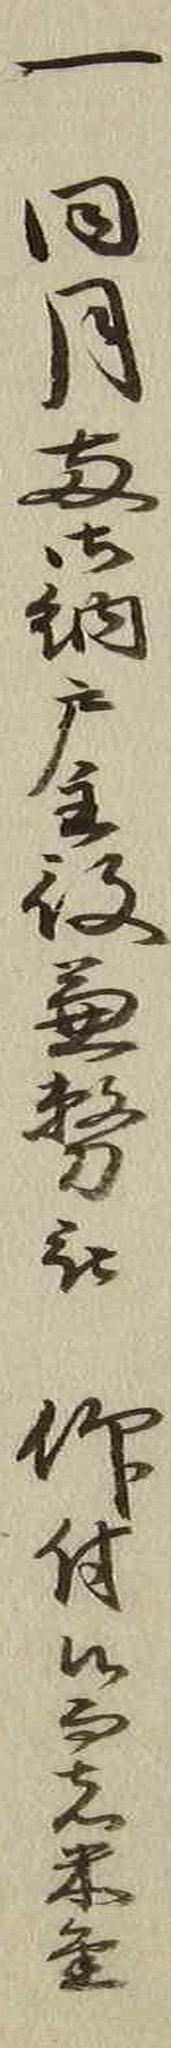一同月両御納戸主役兼務被仰付候而は米金
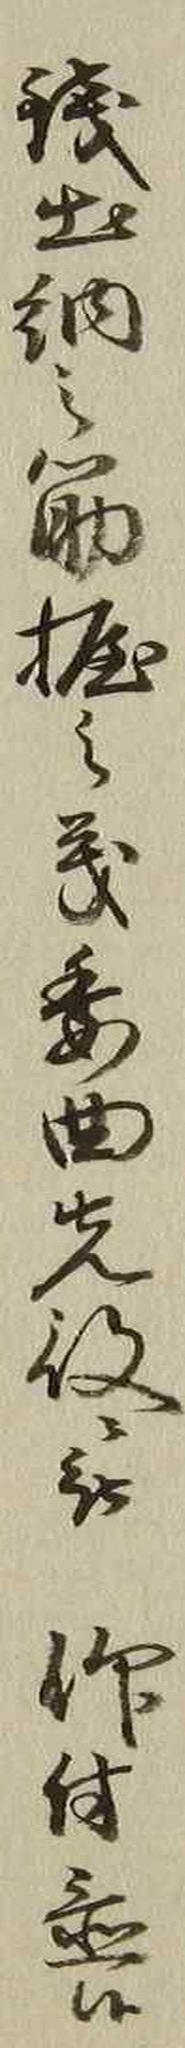銭出納之筋握之義委曲先役に被仰付置候
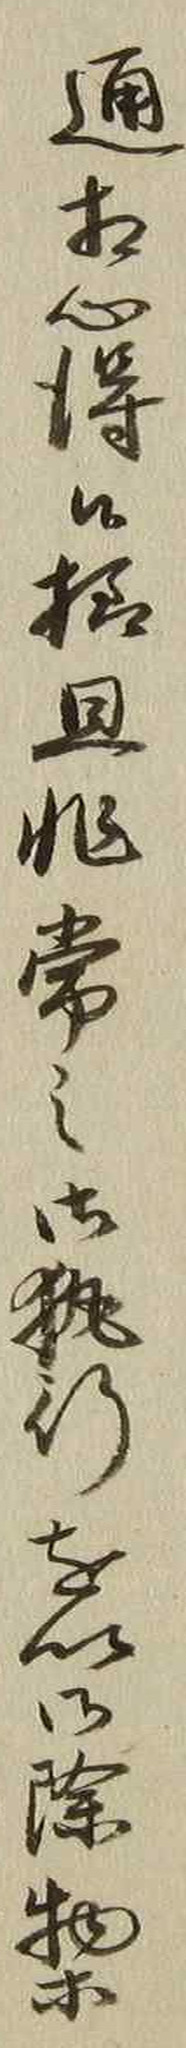通相心得候様且非常之御執行を以御除物等
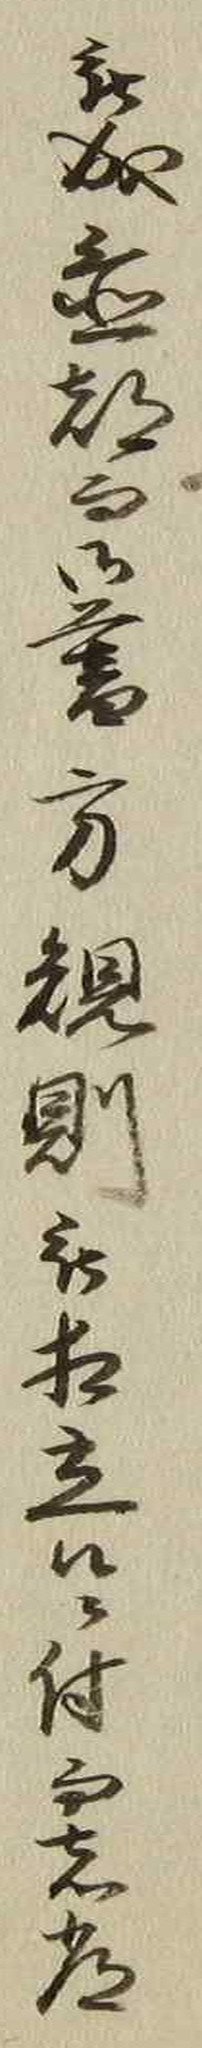被成置都而御暮方規則被相立候に付而は常
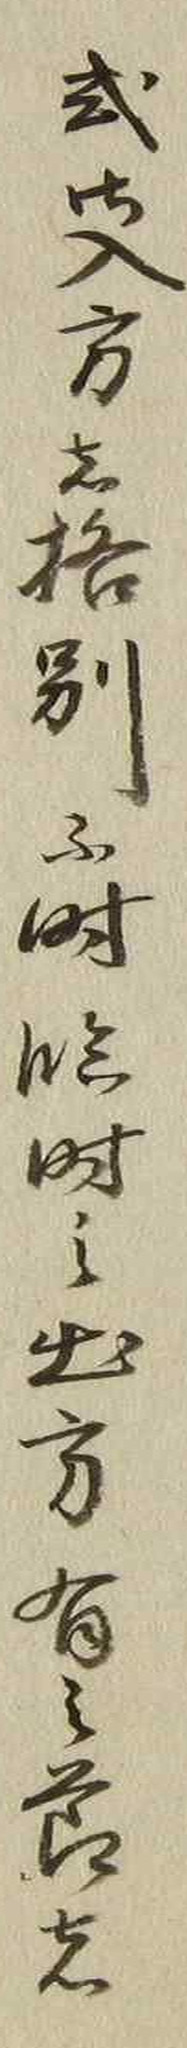式御入方は格別不時臨時之出方有之節は
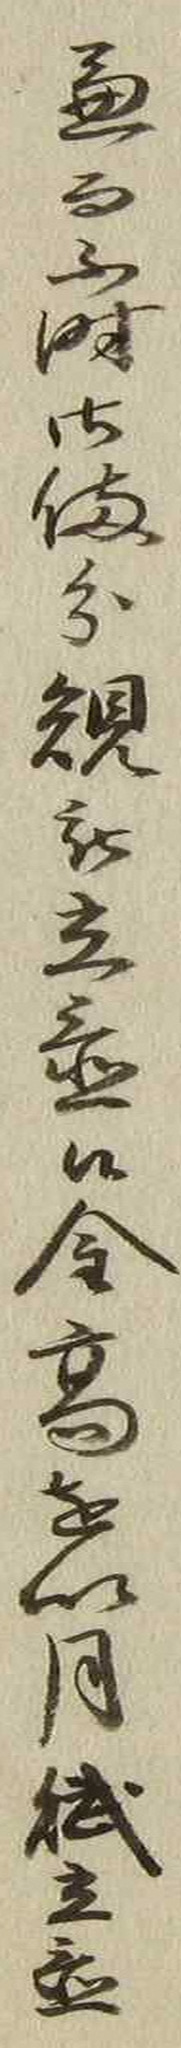兼而不時御備分規被立置候金高を以月賦立置
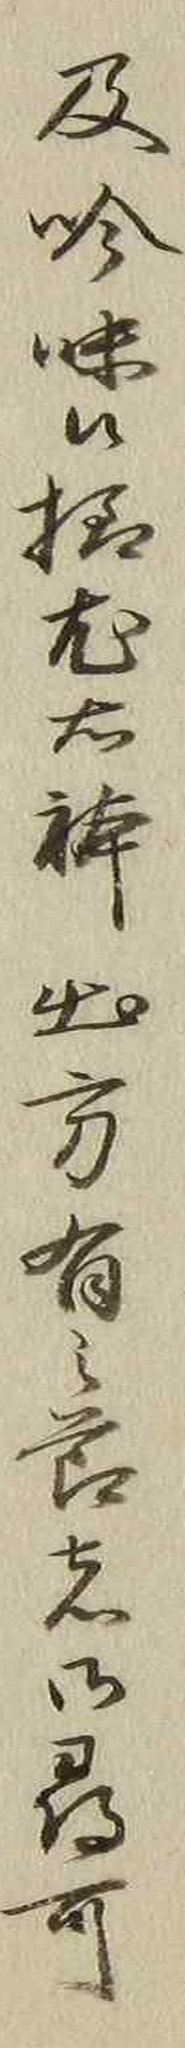及吟味候様尤右体出方有之節は御尋可
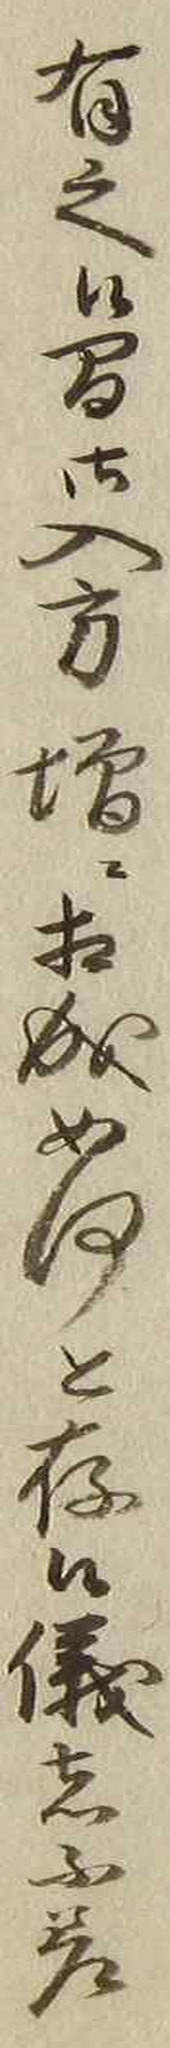有之候間御入方増に相成如何と存候儀は不差
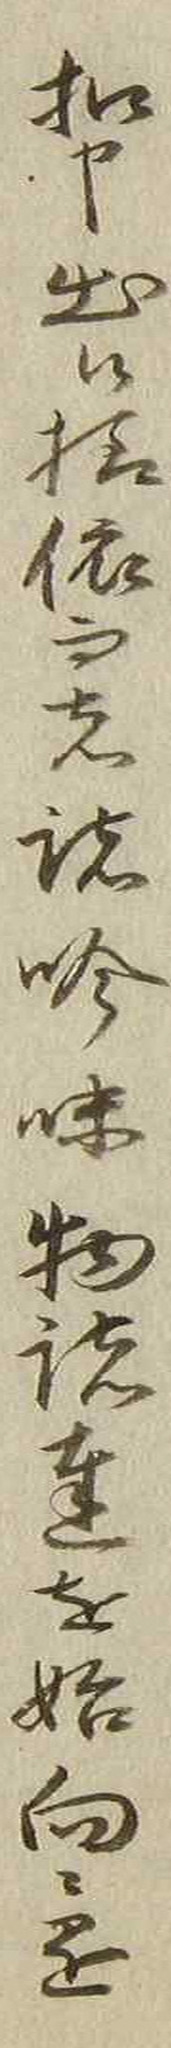扣申出候様依而は諸吟味物諸達を始向に懸
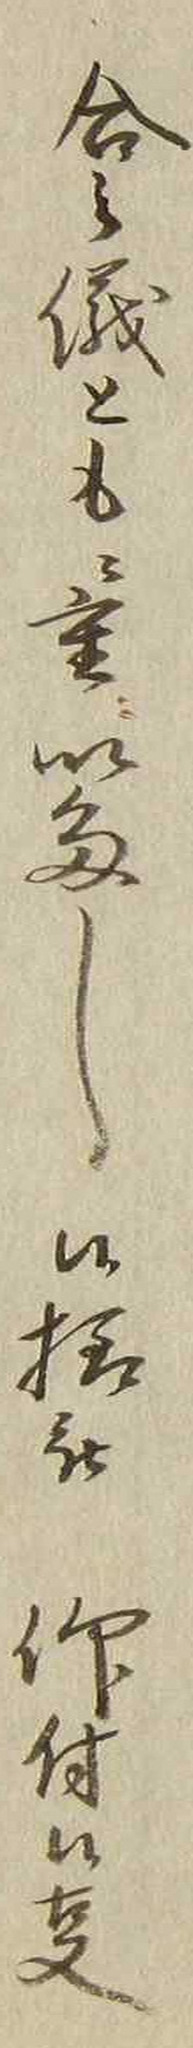合之儀ともに重にいたし候様被仰付候事
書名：諸士系譜　巻之133　た之部9
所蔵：会津若松市立会津図書館
